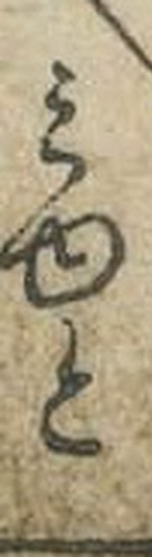みゆと
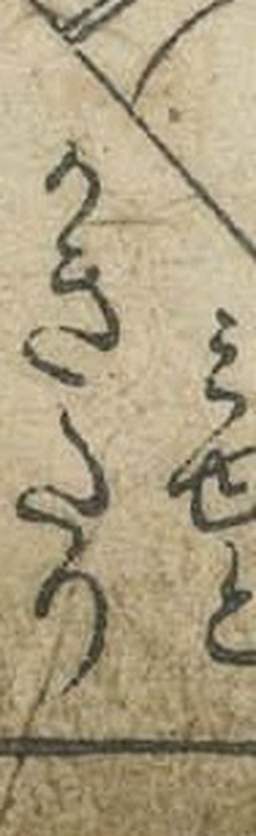かきたり
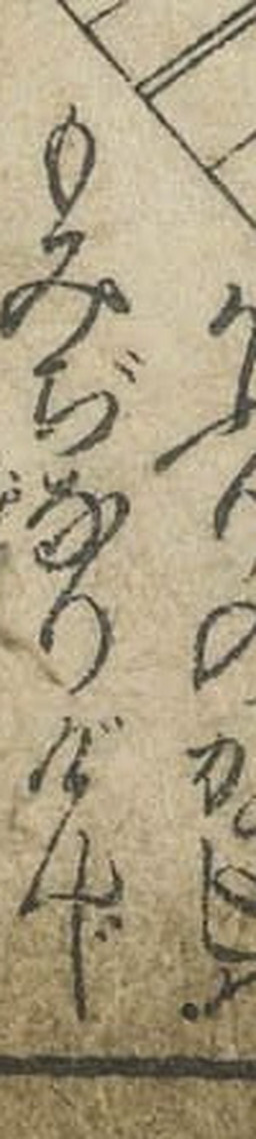もみぢなりげんじ
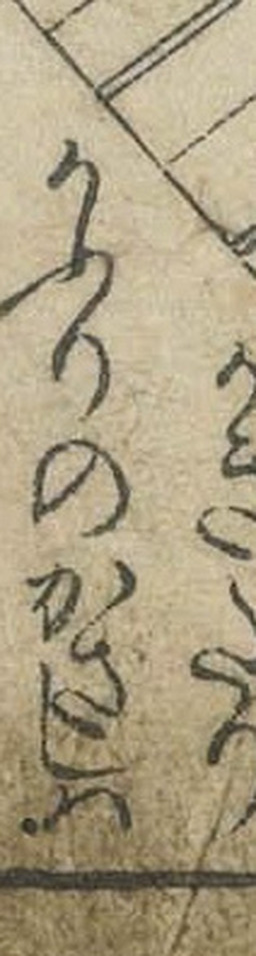かふりのかさしは
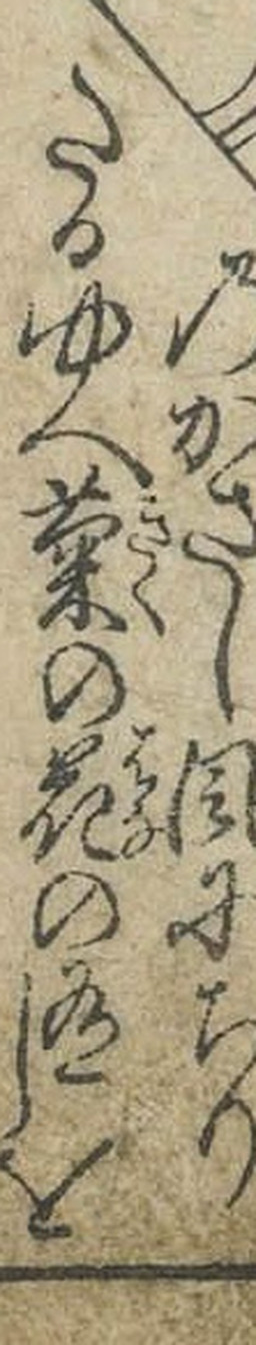たるゆへ菊の花の有しを
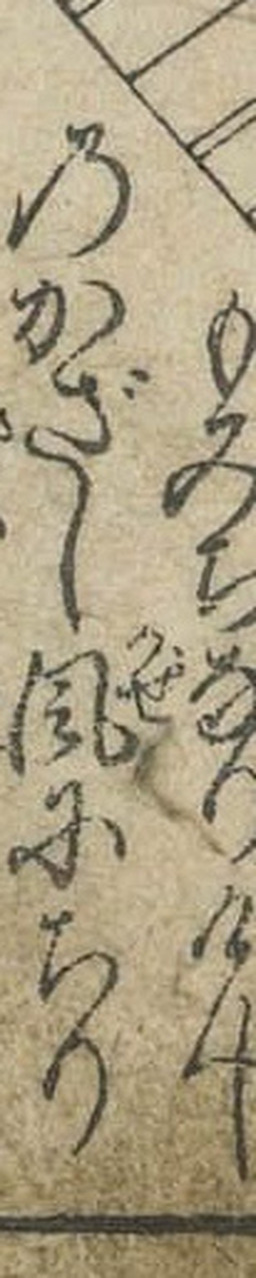のかざし風にちり
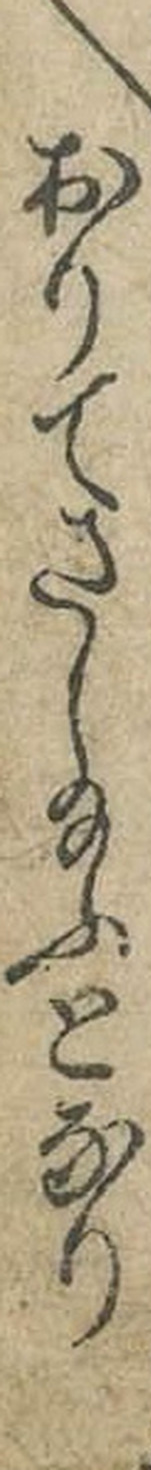おりてさし給ふとなり

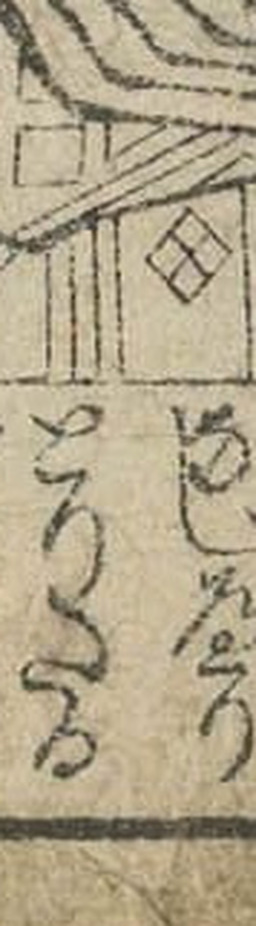とりたる
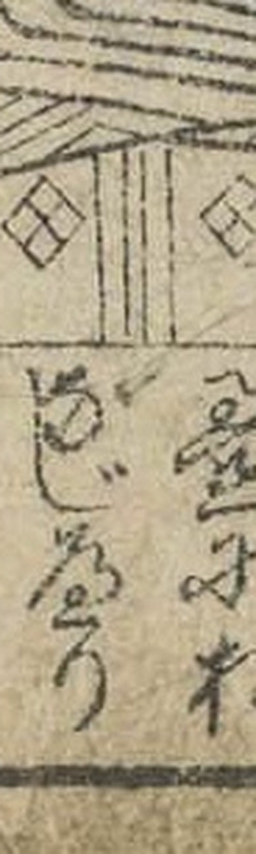なじへり
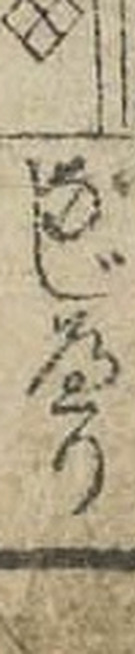なじへり
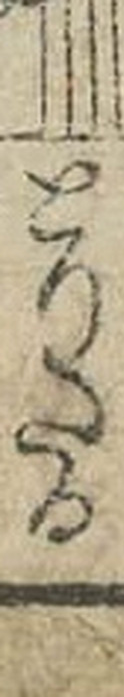とりたる
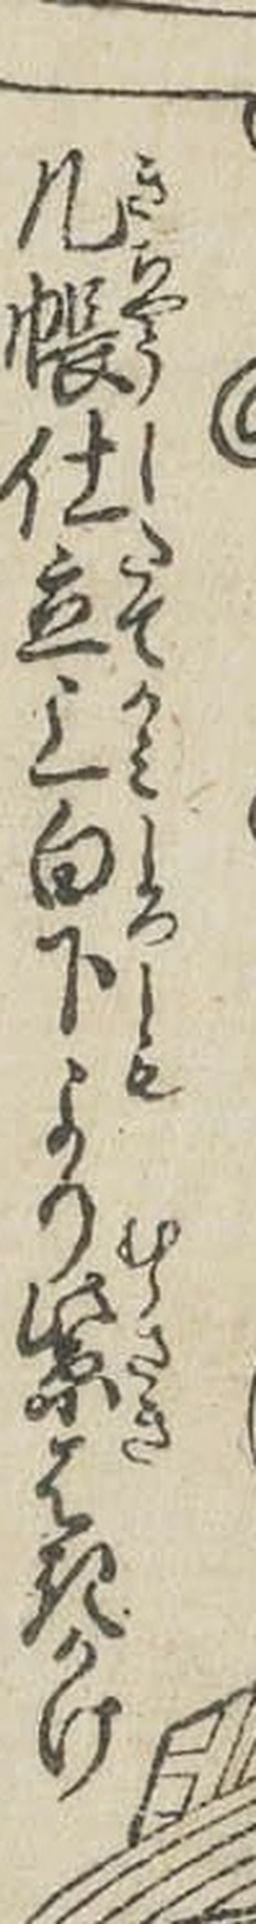几帳仕立上白下より紫はきかけ
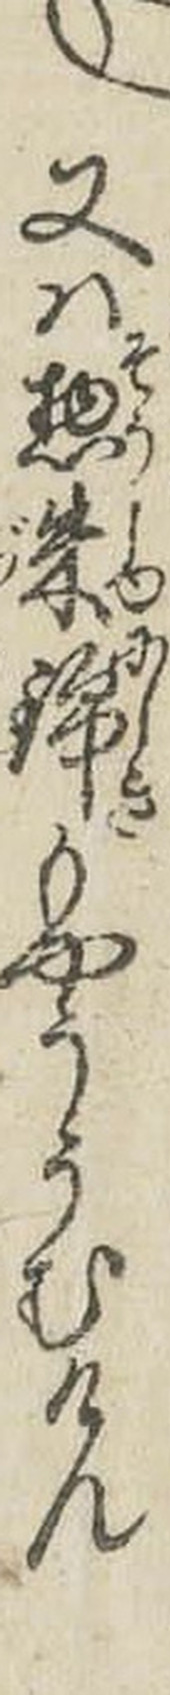又は惣朱錦もやううむけん
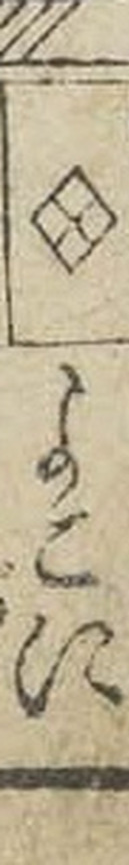よこに
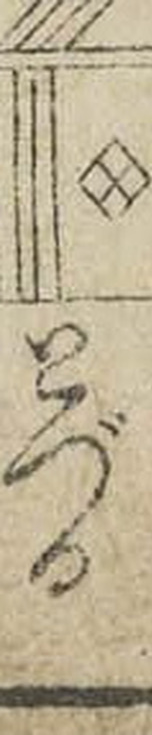とづる
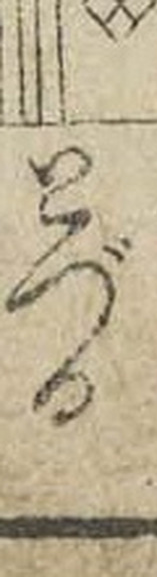とづる
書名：絵本写宝袋 9巻 1之巻
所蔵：東京学芸大学教育コンテンツアーカイブ
